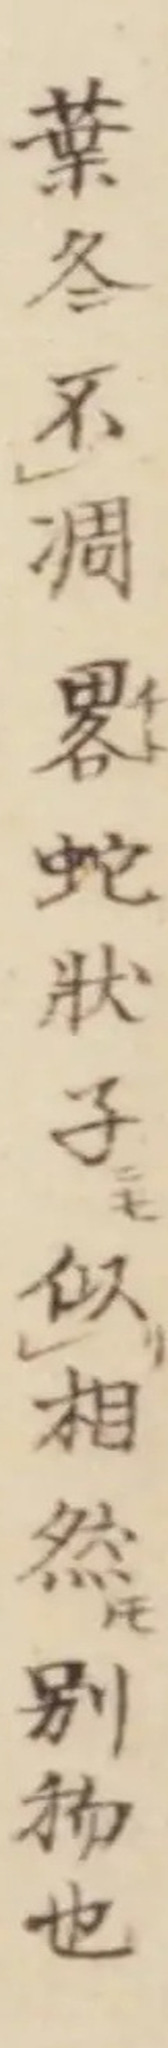葉冬不凋畧蛇状子に似り相然共別物也
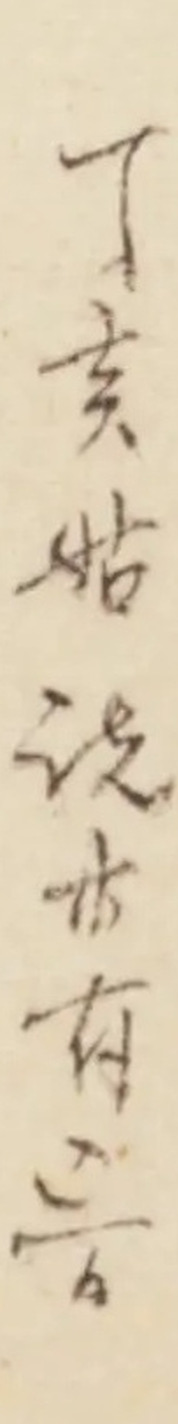丁亥姑洗廿有日
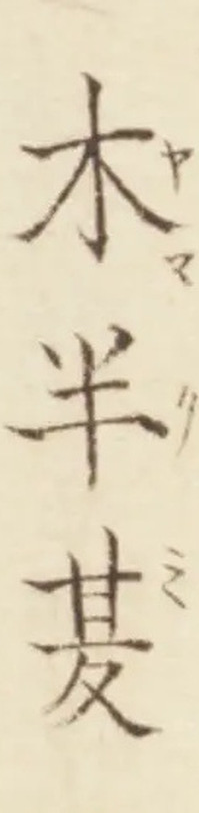木半夏
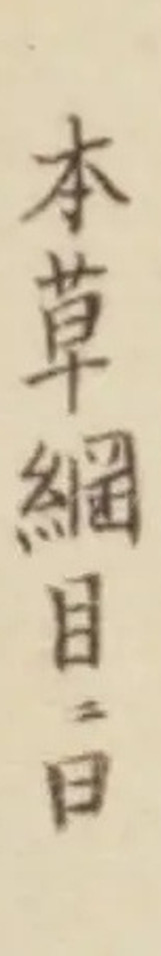本草綱目に曰
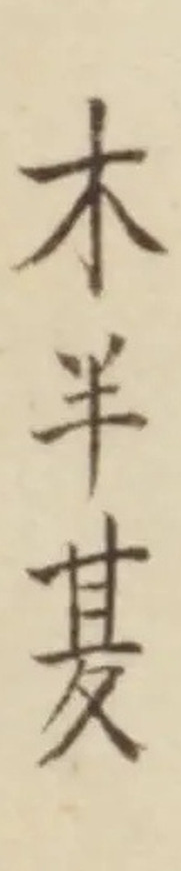木半夏
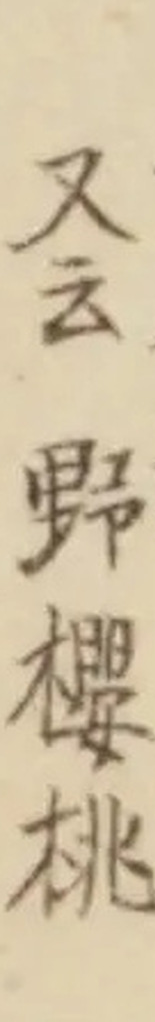又云野櫻桃
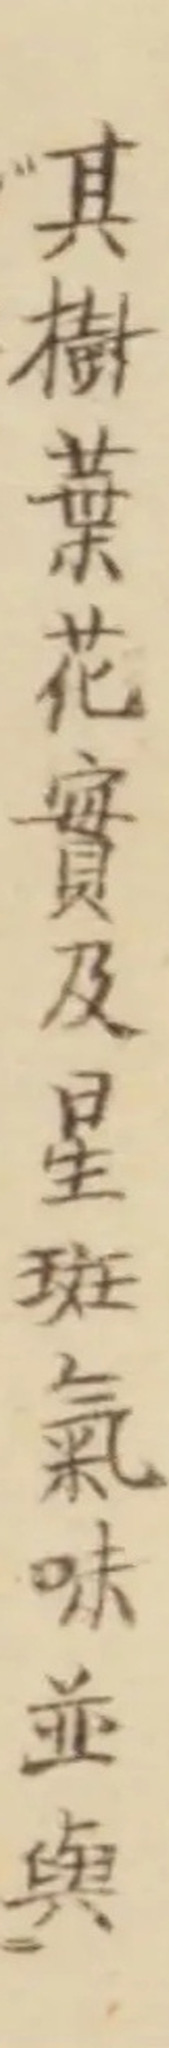其樹葉花實及星斑氣斑並與
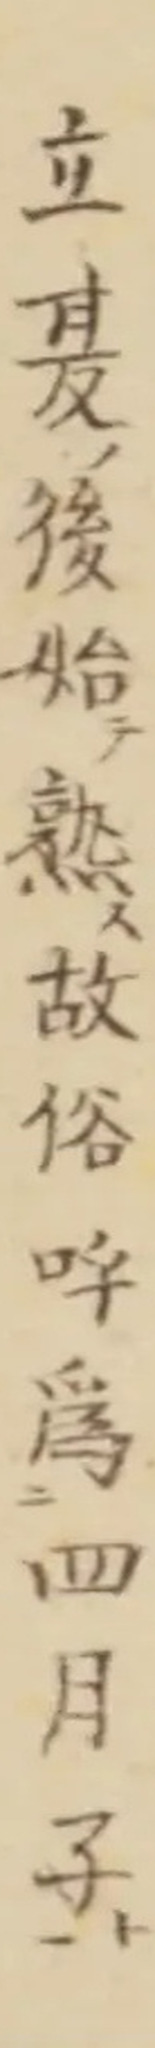立夏の後始て熟す故俗呼爲四月子と
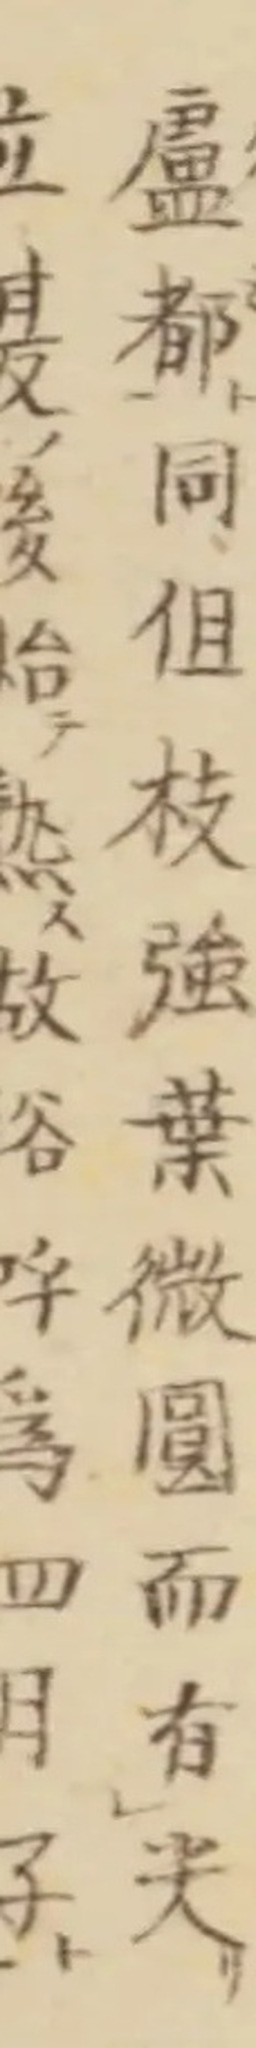立夏の後始て熟す故俗呼爲四月子と

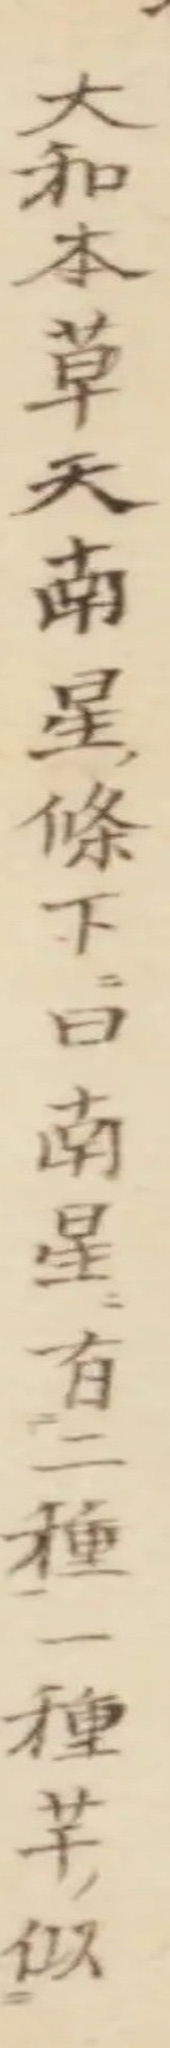大和本草天南星の條下に曰南星に二種一種芋の似
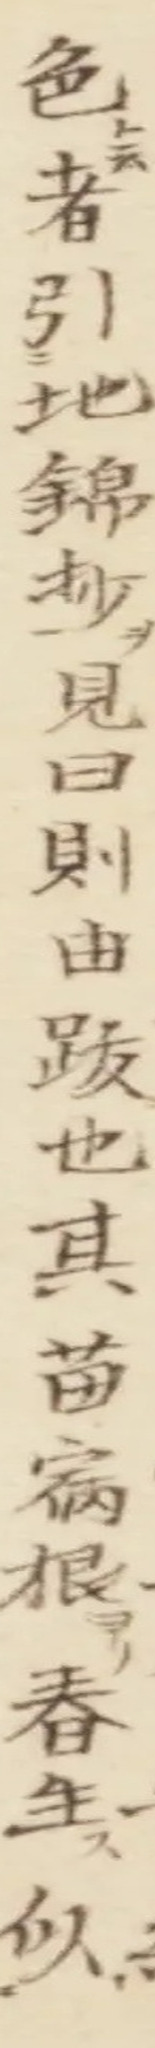色と云者引地錦抄を見曰則由跋也其苗宿根より春生す似て
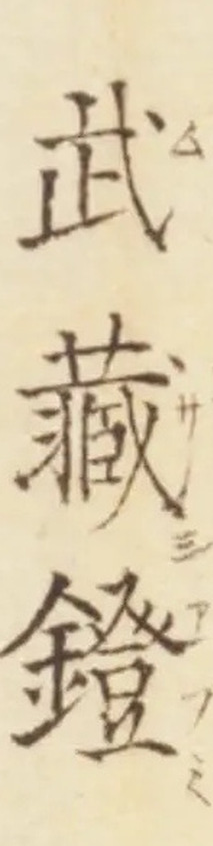武藏鐙
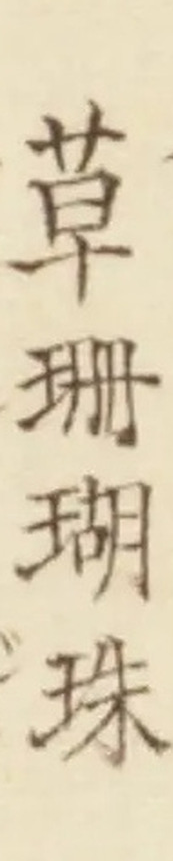草珊瑚珠
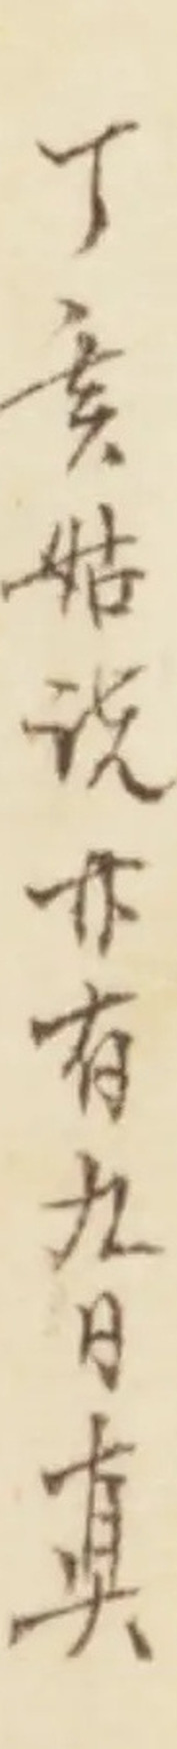丁亥姑洗廿有九日真
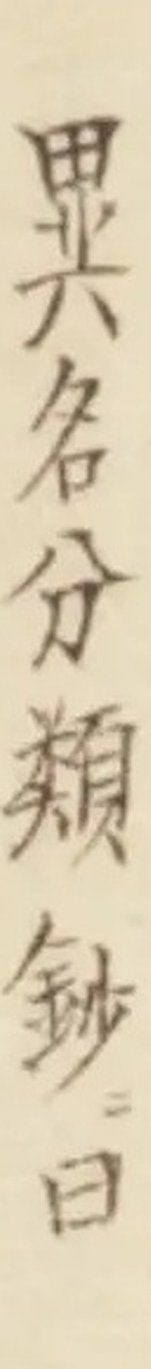異名分類抄に曰
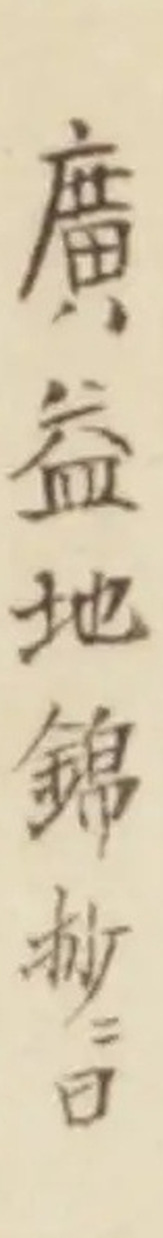廣益地錦抄に曰
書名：梅園草木花譜春之部. 3
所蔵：国立国会図書館 National Diet Library, JAPAN
